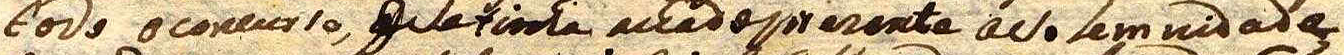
todo o concurso, q̄ se tinha achado prezente a solemnidade
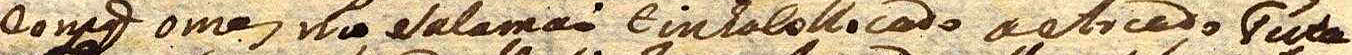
com q̄ o mesmo salamaõ tinha Collocado a Arca do Testa
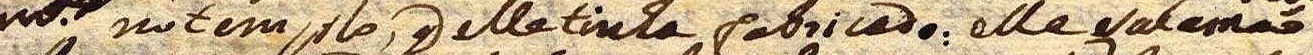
m.to no templo, q̄ elle tinha fabricado: elle salamaõ
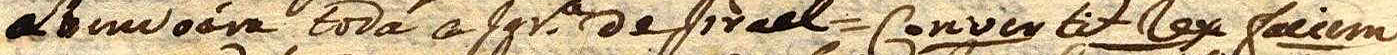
abensoára toda a Jgr.a de Jsrael = Convertit Rex faciem
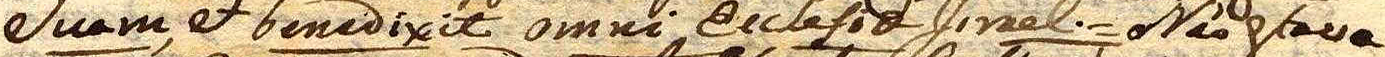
suam, et benedixit omni Ecclesia Jsrael.= Não estaua
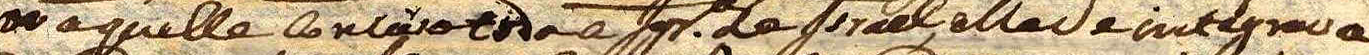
naquelle concurso toda a Jgr.a de Jsrael, ella se integrou a
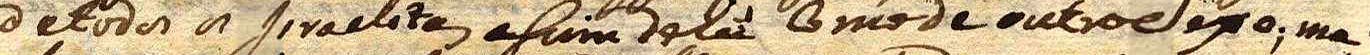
de todos os Jsraelitas assim de hū Como de outro sexo; ma
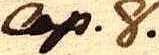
cap. 8.
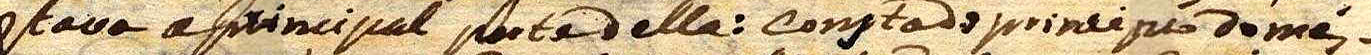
estava a principal parte della: consta do principeo do mes
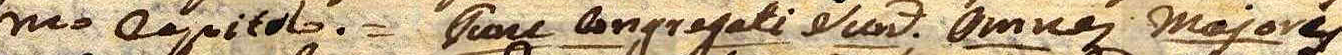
mo capitolo.= Tunc congregati sunt. omnes majores
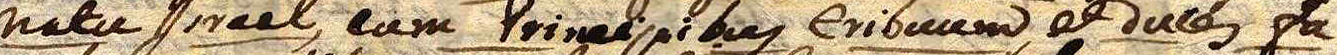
natu Jsrael, cum Principibus tribuum, et duces fa
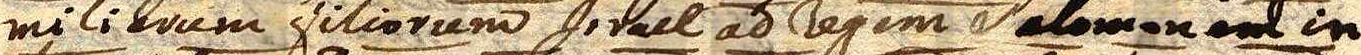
miliarum filiorum Jsrael ad Regem. Salomonem in
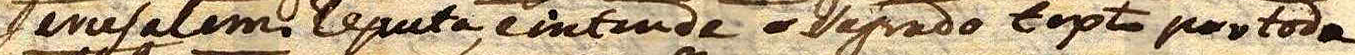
Jerusalem. Reputa, e intende o sagrado texto por toda
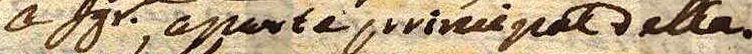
a Jgr.a, a parte principal della.
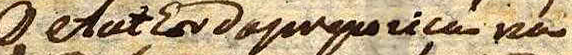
O Author do prepoziçaõ não
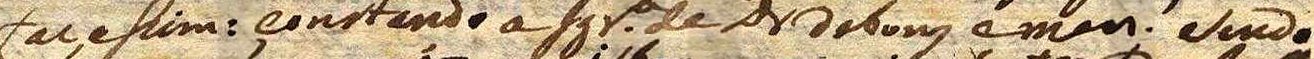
foi, essim: constando a Jgr.a de Ds̄. de bons e maos. sendo
